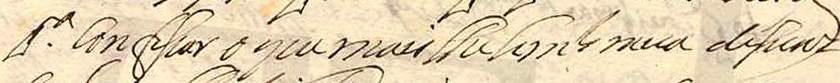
p.a confessar o que mais lhe lembraua de suaz
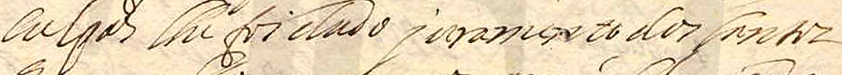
culpas lhe foi dado juramento dos santoz
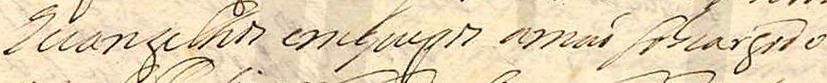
Euangelhos em que pos a maõ sob cargo do
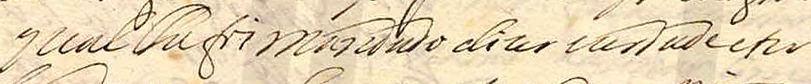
qual lhe foi mandado dizer uerdade e ter
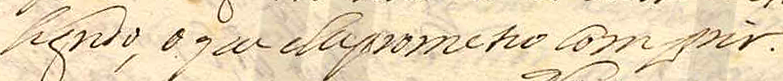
segredo, o que ele prometeo comprir
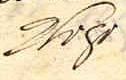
E logo
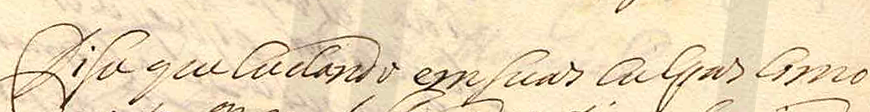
Disse que Cudando em suas culpas como
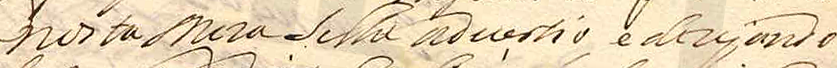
nesta meza se lhe advertio, e dezejando
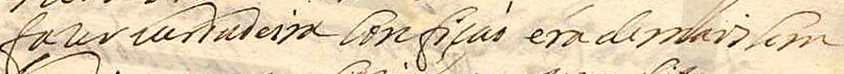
fazer uerdadeira Confiçaõ era demais lem
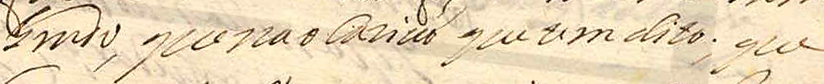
brado, que na ocazião que tem dito; que
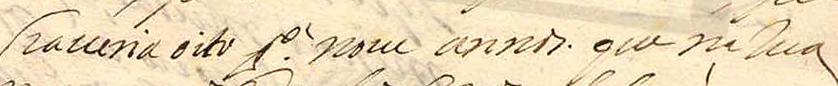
haueria oito p.a noue annos que na Rua
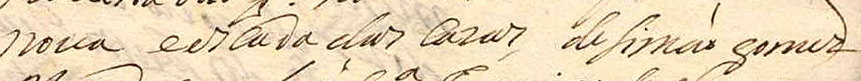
noua e escada das cazas, de simaõ gomez
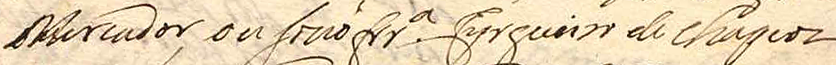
Mercador, ou Joaõ frr.a Cyrgueiro de chapeoz
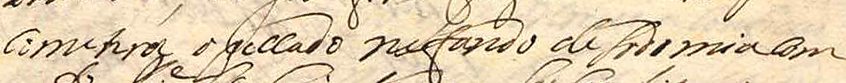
cometera o peccado nafando de sodomia com
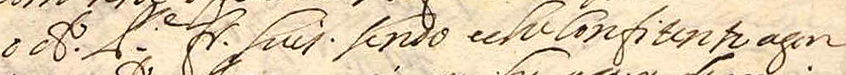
o d̄o. P.e fr. Luis. sendo e elle Confitente agen
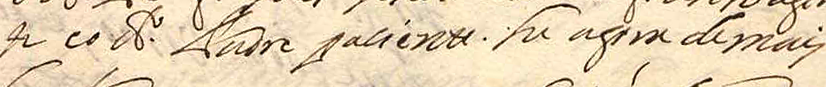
te e o d̄.o Padre paciente. he agora de mais
